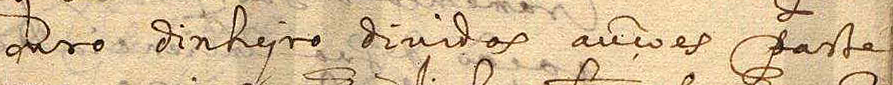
ouro dinhejro diuidas auções parte
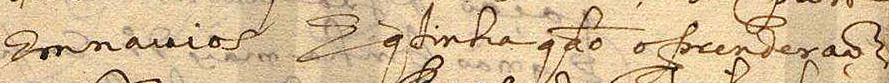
Em nauios E q̄ tinha q̄do o prenderaõ
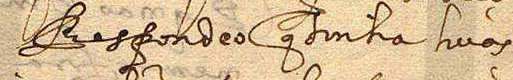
Respondeo q̄ tinha huās
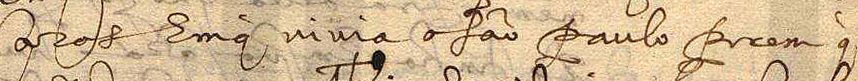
Cazas Em q̄ uiuia a são paulo porem q̄
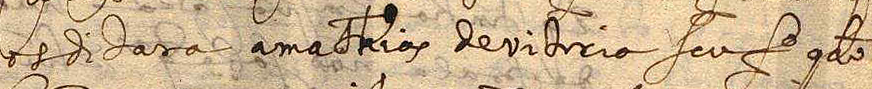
as ditara a mathias de vitoria seu fo qdo
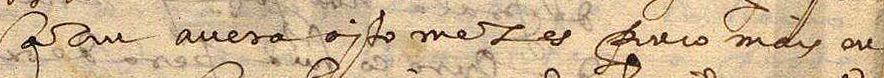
Cazou auera ojto mezes pouco mais ou
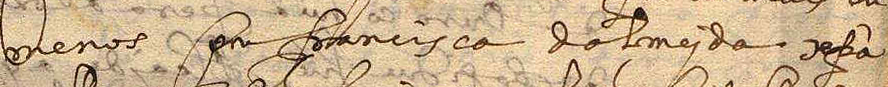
menos Com francisca dalmejda xpā
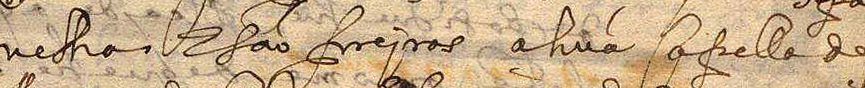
uelha E saõ forejras a huā Capella de
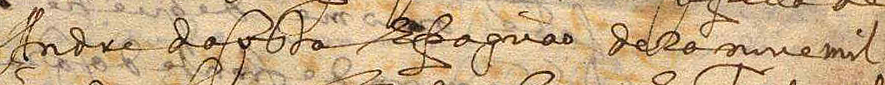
Andre da Costa E paguão dezanoue mil
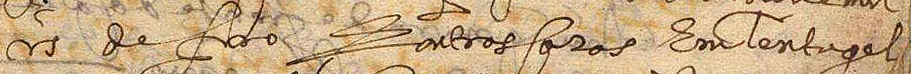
rs̄ de foro E outras Cazas Em Tentugel
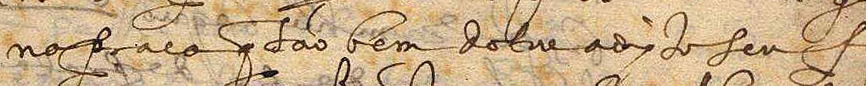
na praca q̄ taõ bem dotou a dito seu f
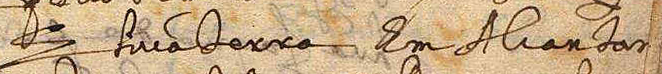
E huā terra Em Alcantar
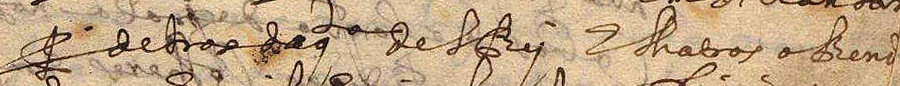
ꝑ detras da qta del Rej E lha tras aRend
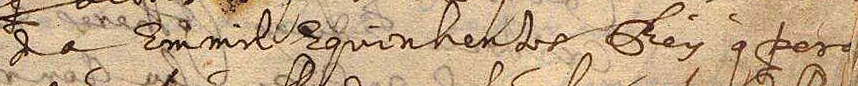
da Em mil E quinhentos Reis q̄ pera
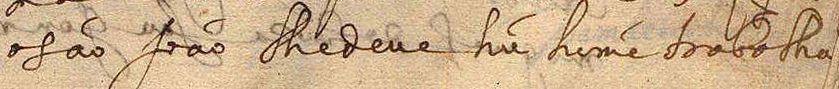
o saõ João lhe deue hū homē trabalha
